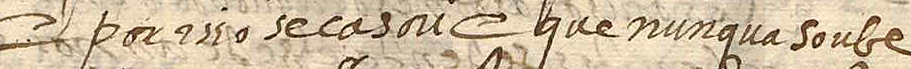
e por isso se casou e que nunqua soube
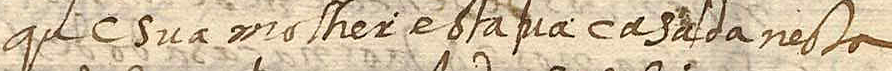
que sua molher estaua casada nesta
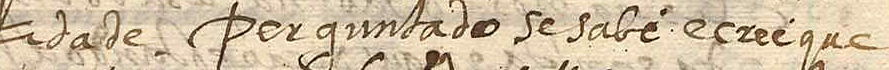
cidade. Perguntado se sabe e cree que
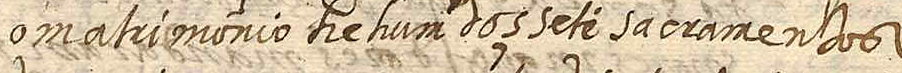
o matrimonio he hum̄ dos sete sacramentos
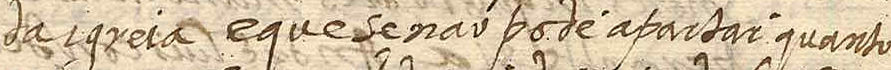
da igreia e que se naõ pode apartar quanto
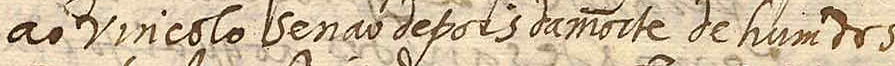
ao vincolo senaõ depois da morte de hum dos
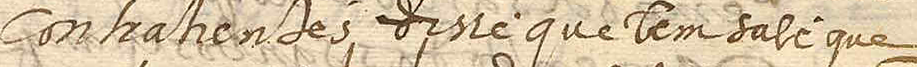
contrahentes disse que bem sabe que
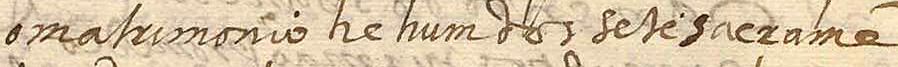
o matrimonio he hum dos sete sacramē
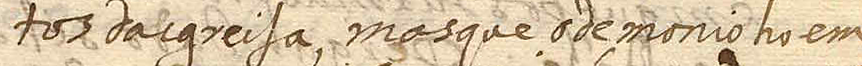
tos da igreJa, mas que o demonio ho em
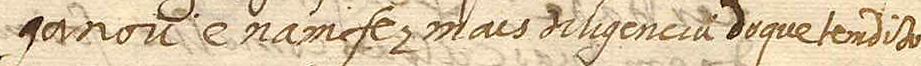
ganou e nam fez mais diligencia do que tem dito
